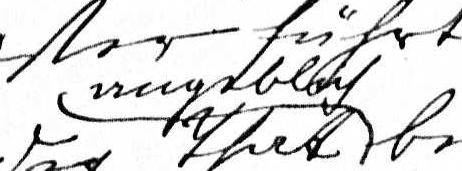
angeblich
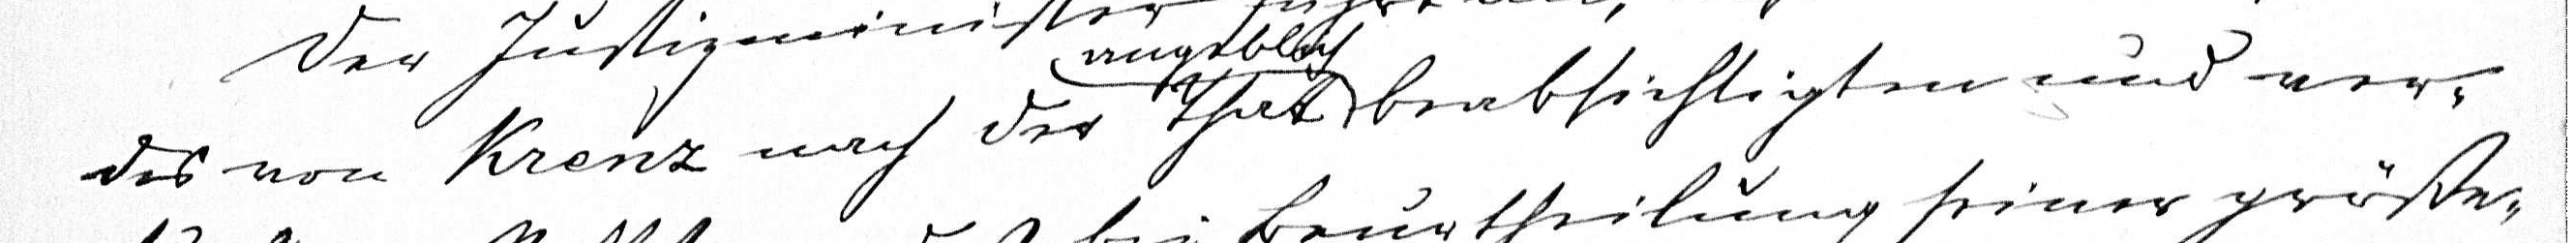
des von Krenz nach der That beabsichtigten und ver¬
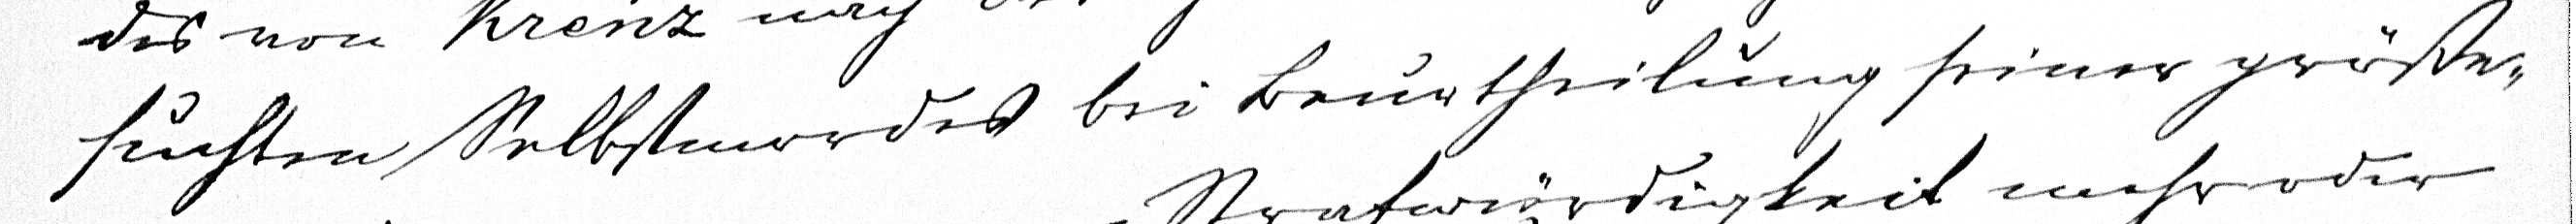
suchten Selbstmordes bei Beurtheilung seiner größe¬
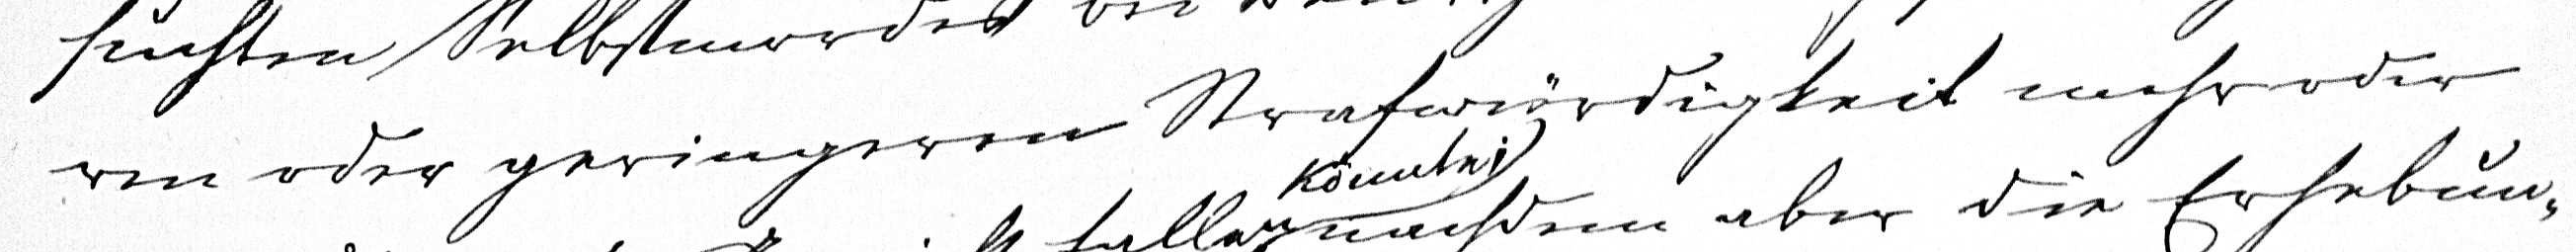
ren oder geringeren Strafwürdigkeit mehr oder
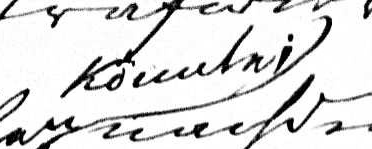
könnte;
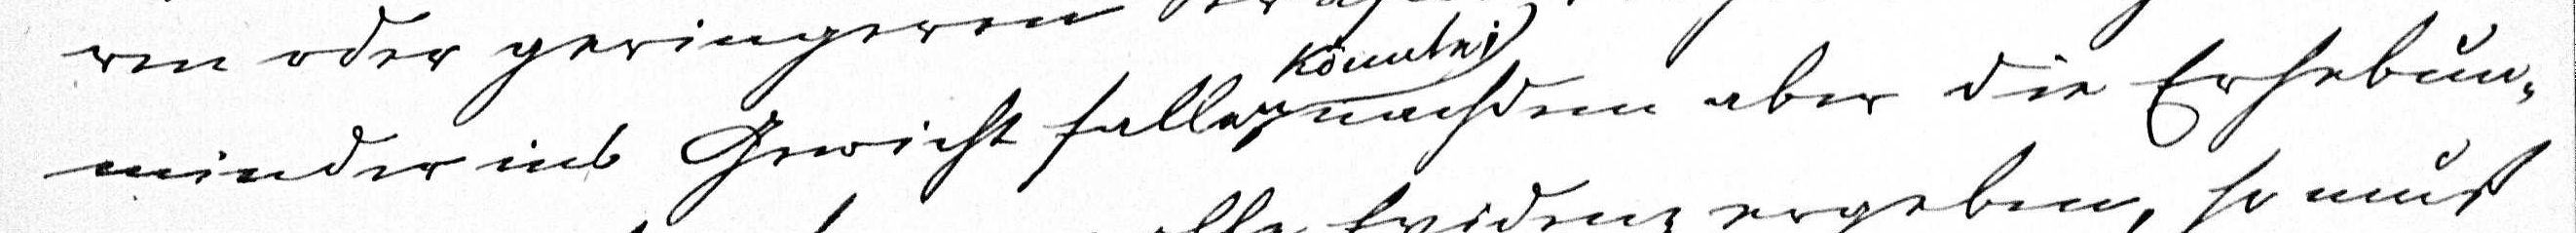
minder ins Gewicht falle nach den aber die Erhebun¬
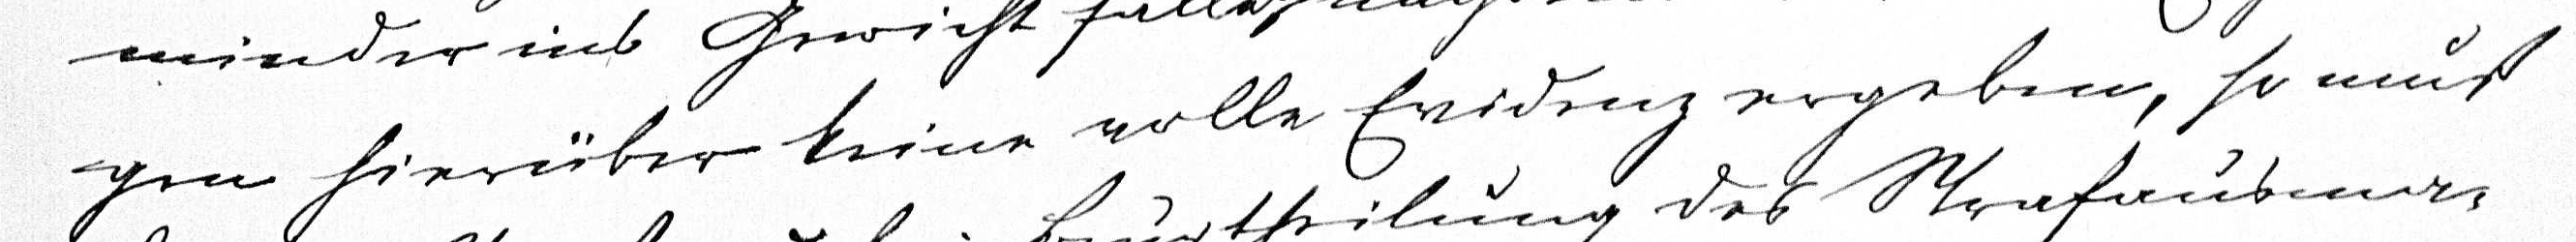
gen hierüber keine volle Evidenz ergeben, so muß
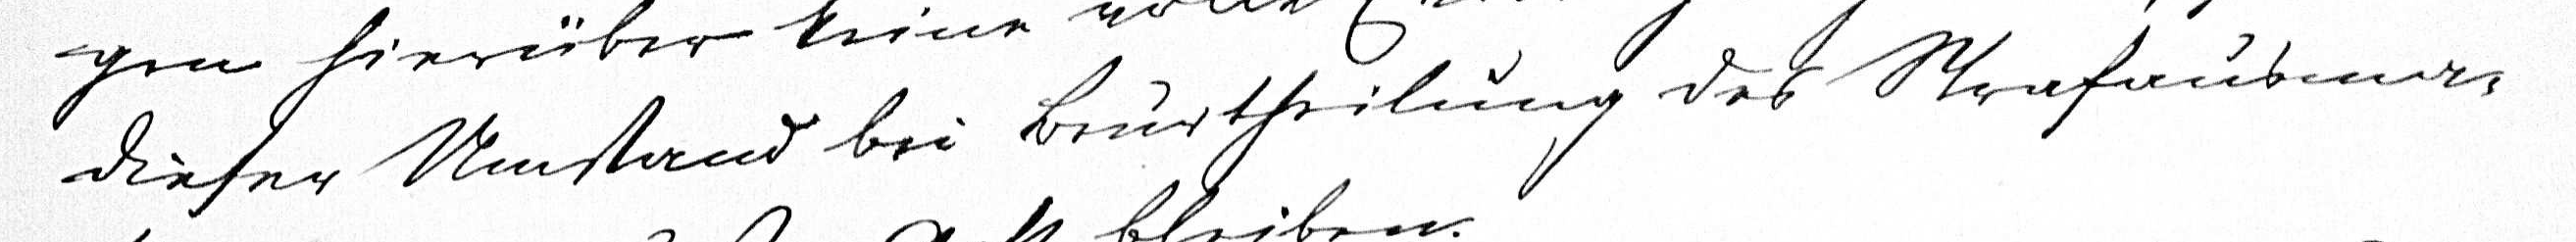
dieser Umstand bei Beurtheilung des Strafausma¬
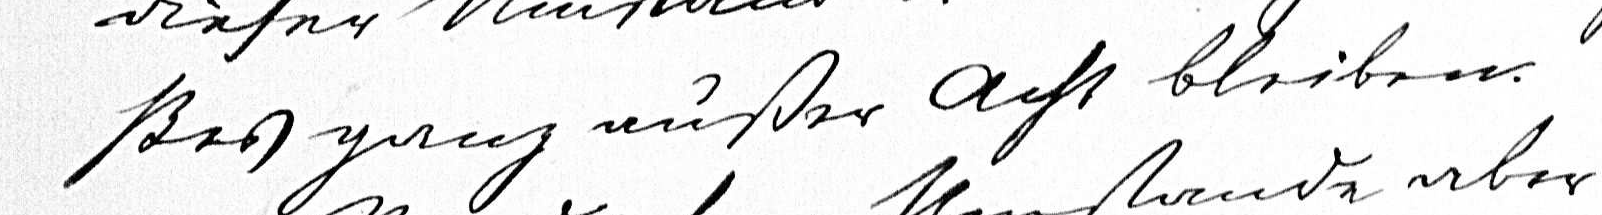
ßes ganz außer Acht bleiben.
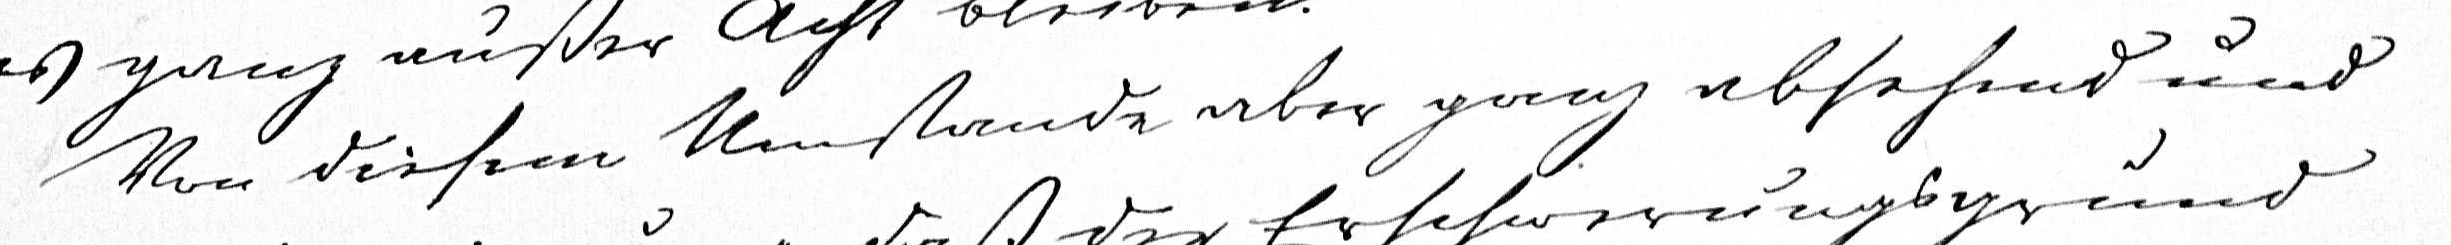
Von diesem Umstande aber ganz absehend und
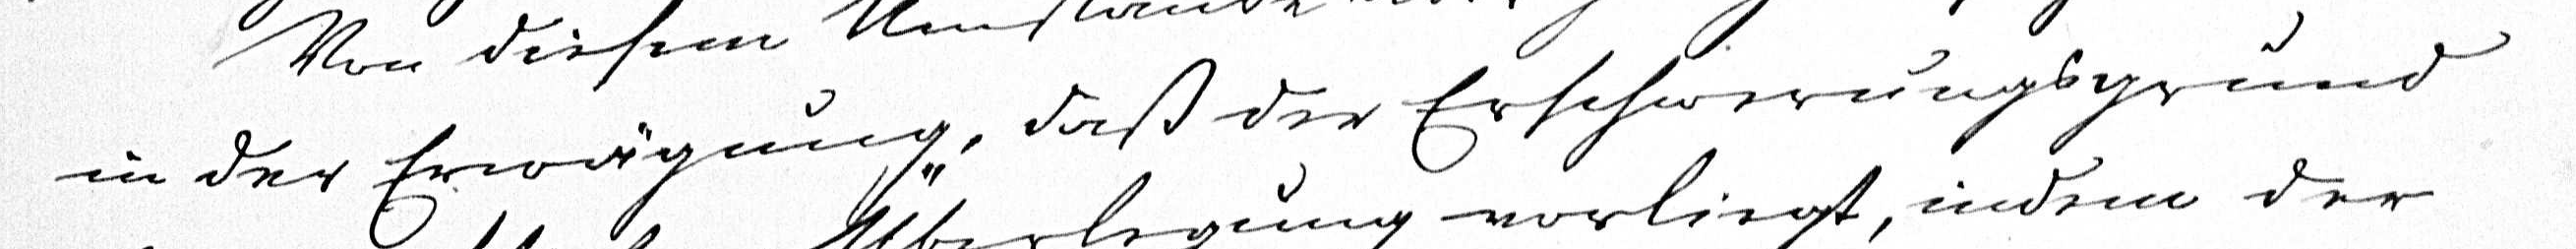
in der Erwägung, daß der Erschwerungsgrund
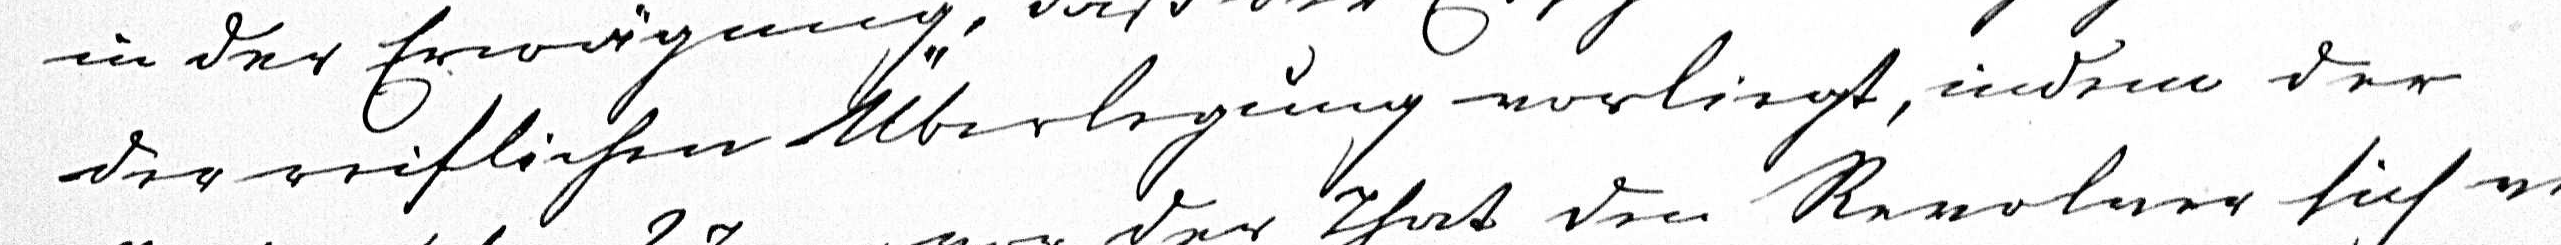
der reiflichen Überlegung vorliegt, indem der
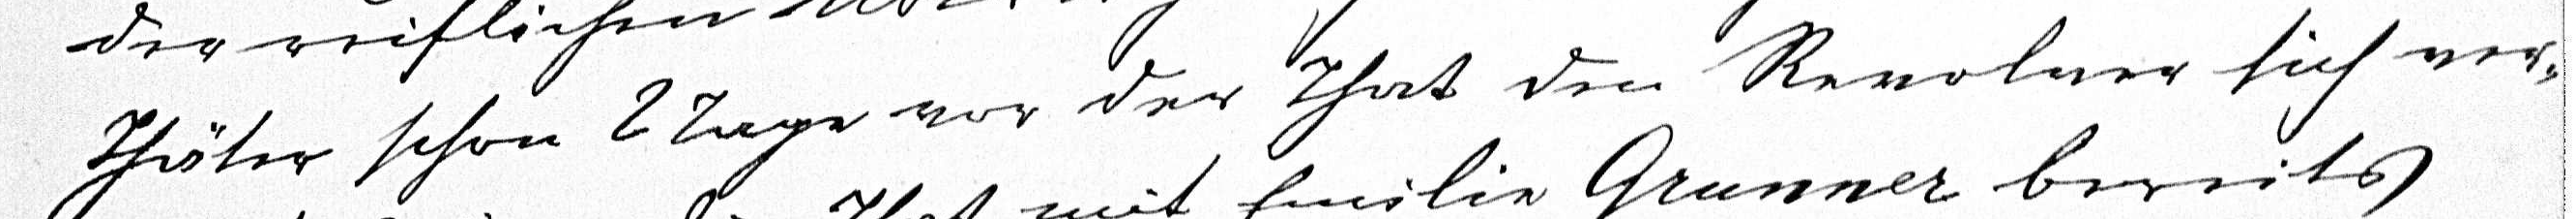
Thäter schon 2 Tage vor der That den Revolver sich ver¬
